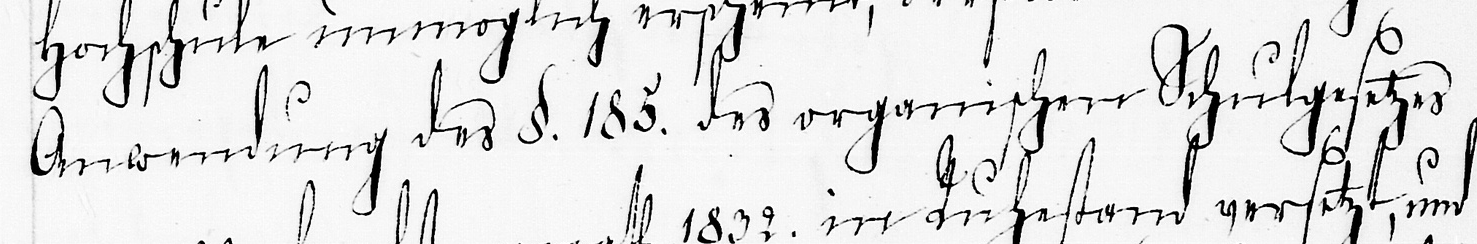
Anwendung des §. 185. des organischen Schulgesetzes
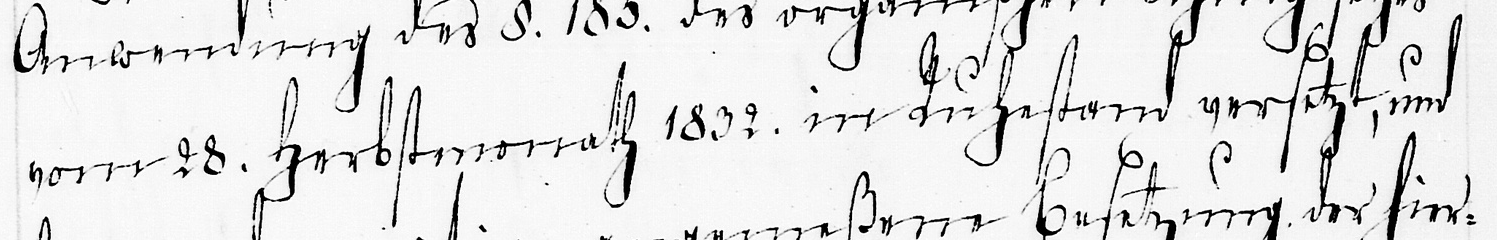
vom 28. Herbstmonath 1832. in Ruhestand versetzt, und
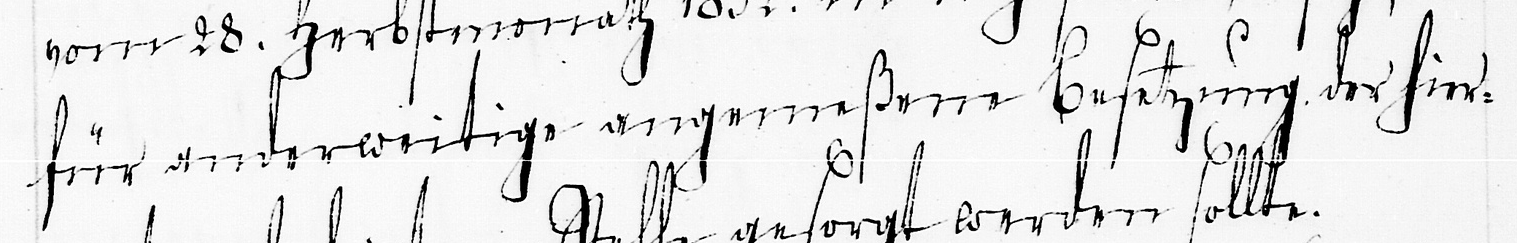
für anderweitige angemeßene Besetzung der hier¬
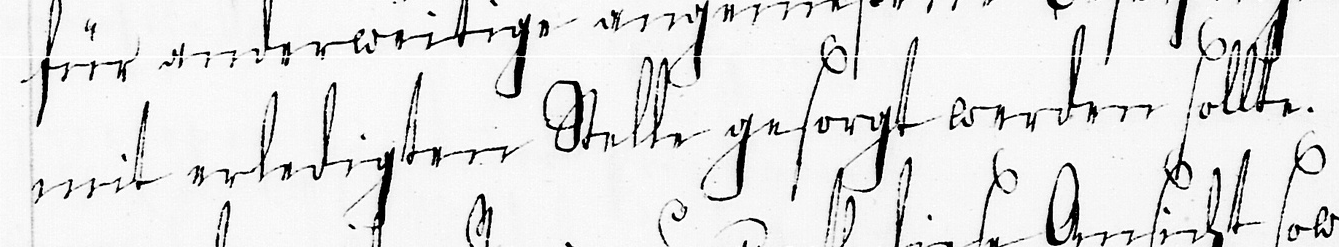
mit erledigten Stelle gesorgt werden sollt¬
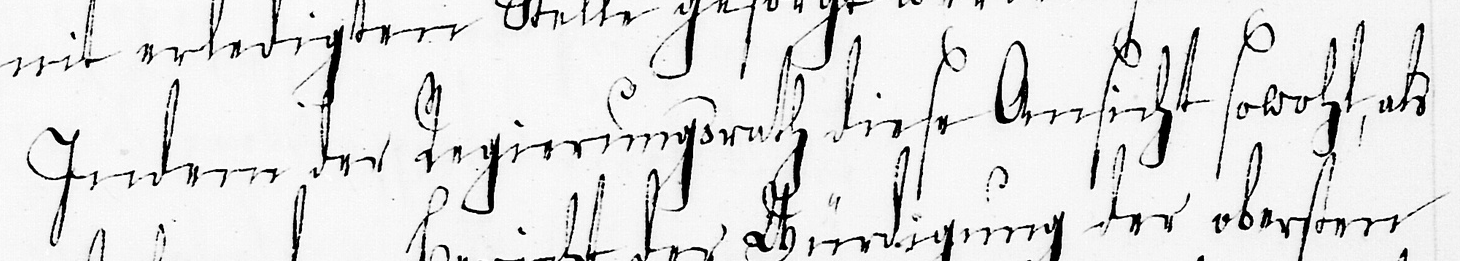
Indem der Regierungsrath diese Ansicht sowohl,
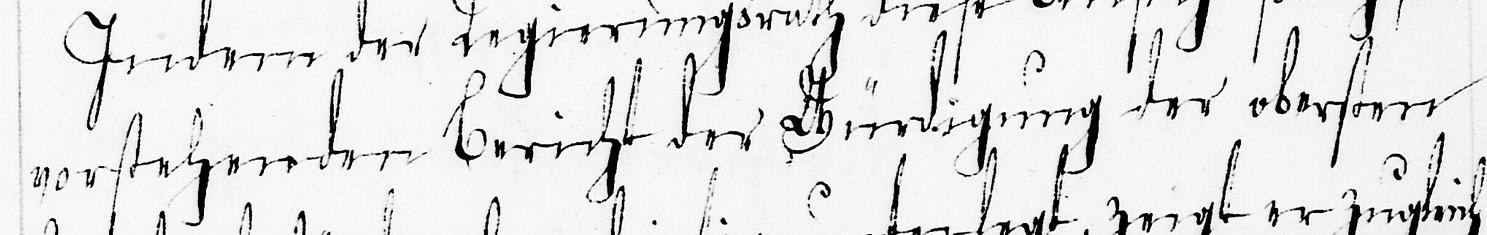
vorstehenden Bericht der Würdigung der obersten
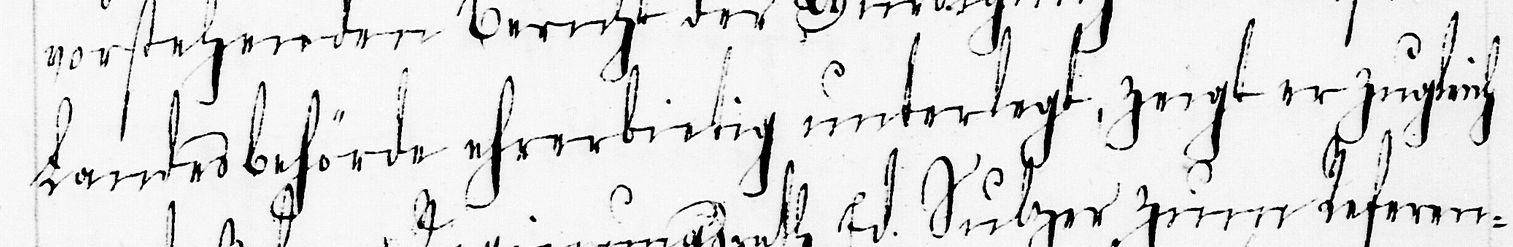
Landesbehörde ehrerbietig unterlegt, zeigt er zuglei¬
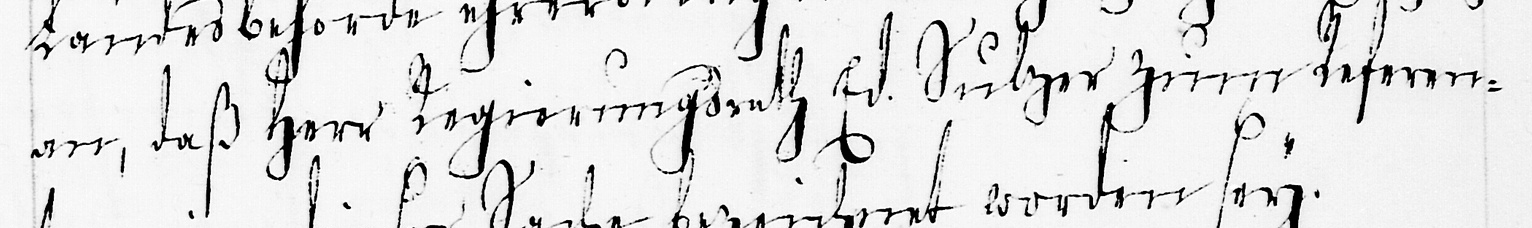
an, daß Herr Regierungsrath Ed. Sulzer zum Referen¬
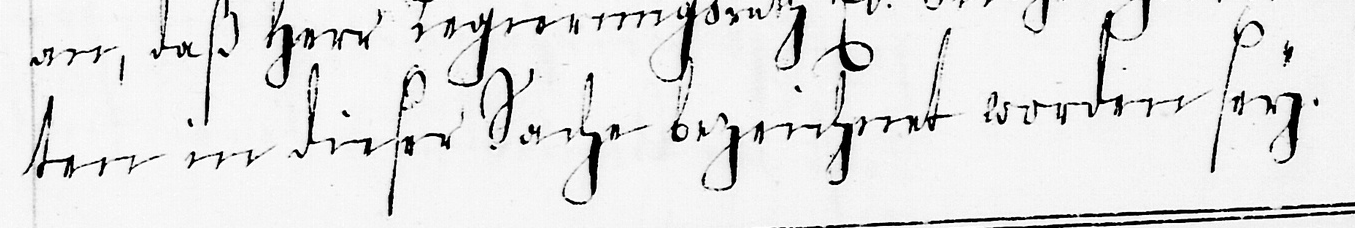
ten in dieser Sache bezeichnet worden sey.
